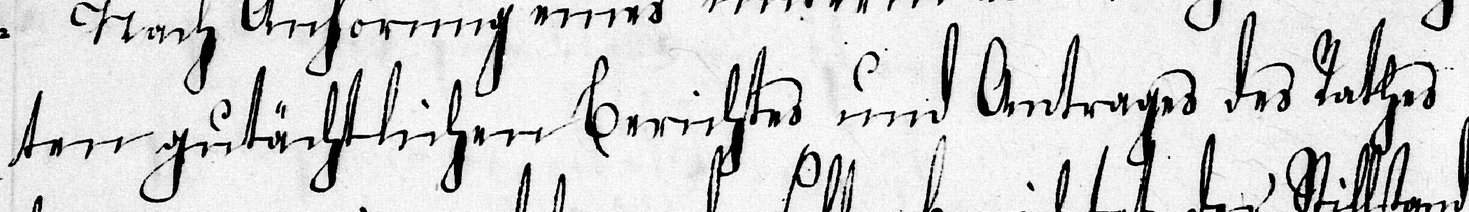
ten gutächtlichen Berichtes und Antrages des Rathes
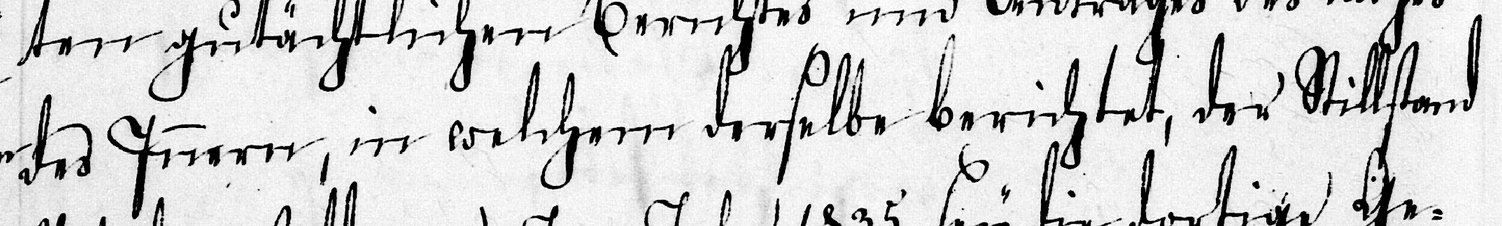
des Innern, in welchem derselbe berichtet, der Stillsta¬
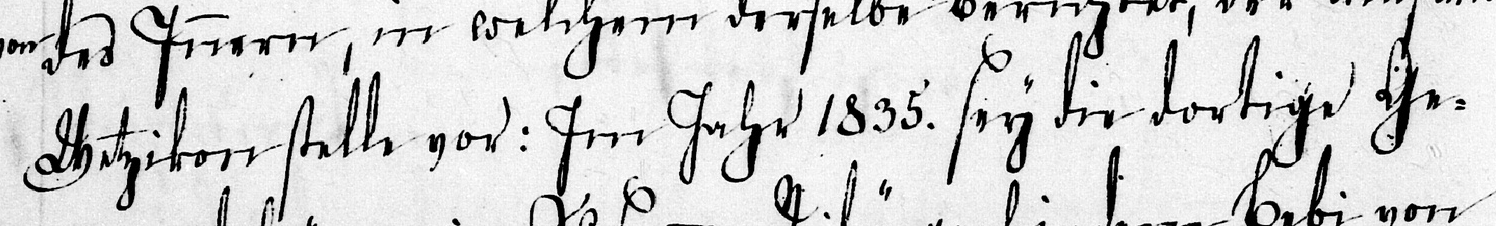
Wetzikon stelle vor: Im Jahre 1835. sey die dortige Ge¬
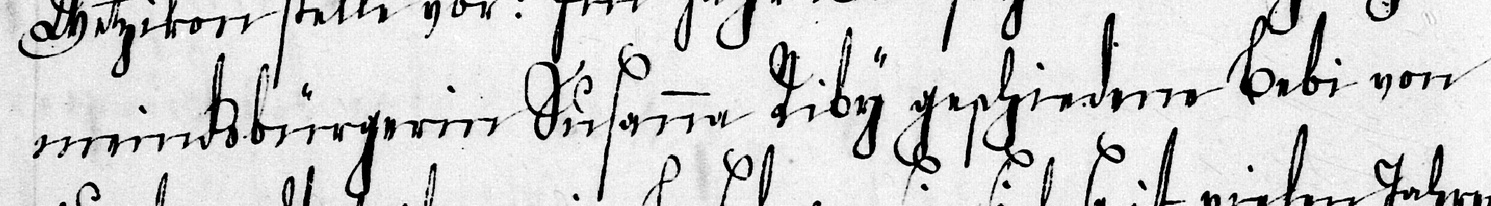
meindsbürgerin Susanna Riby geschiedene Bebi von
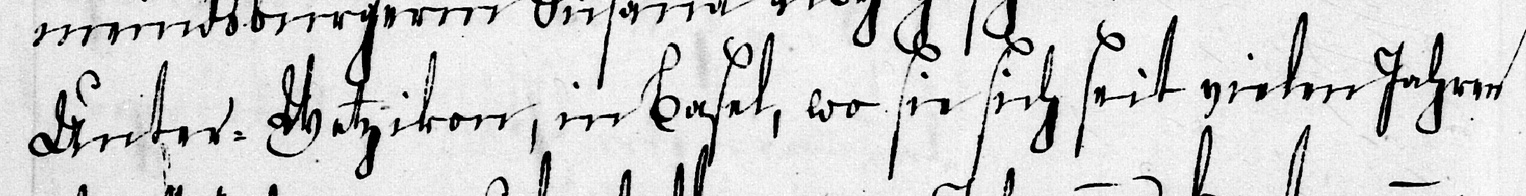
Unter-Wetzikon, in Basel, wo sie sich seit vielen Jahren
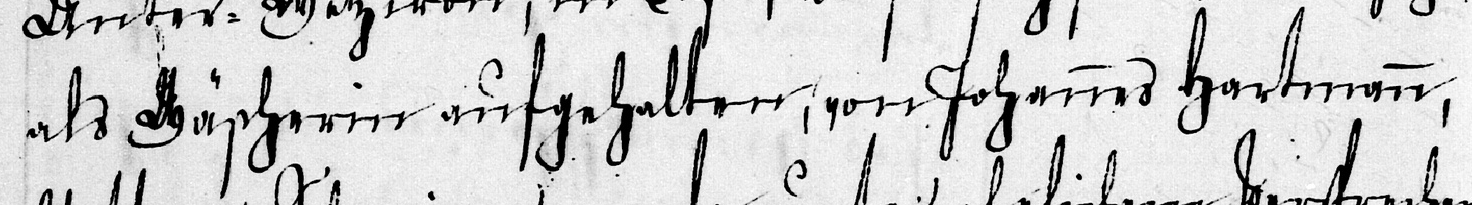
als Wäscherin aufgehalten, von Johannes Hartmann,
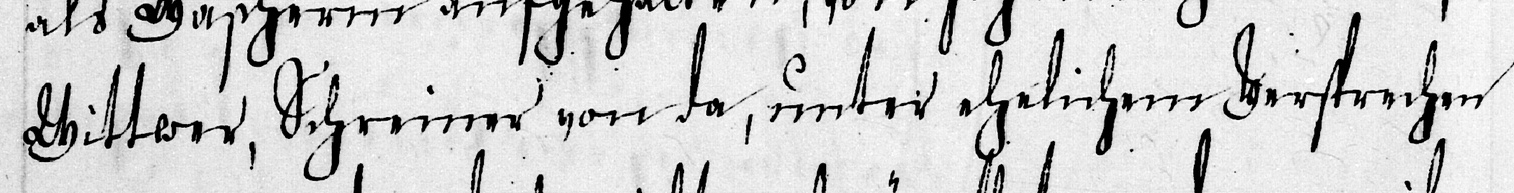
Wittwer, Schreiner von da, unter ehelichem Versprechen
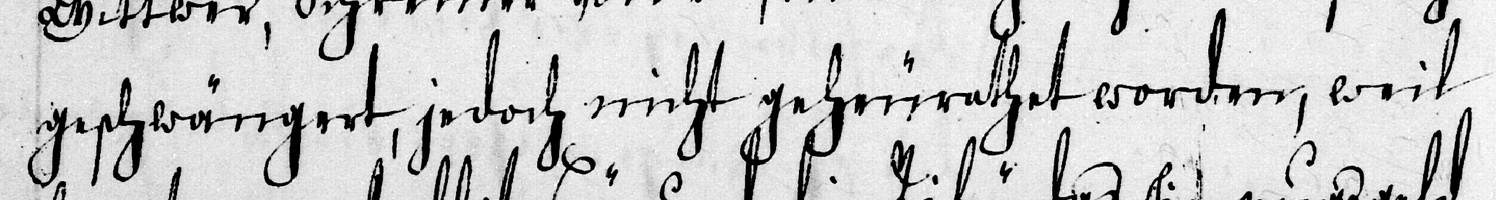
geschwängert, jedoch nicht geheurathet worden, weil
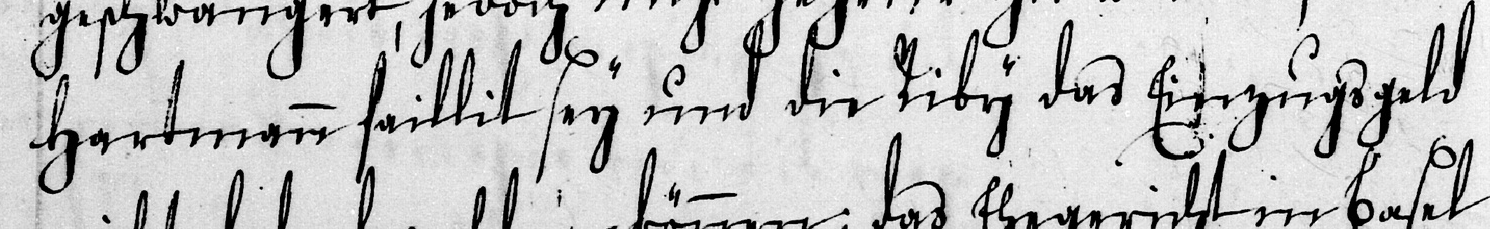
Hartmann faillit sey und die Riby das Einzugsgeld
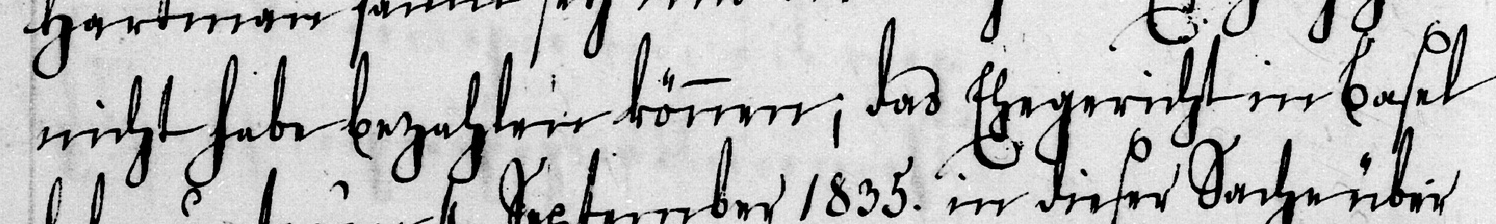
nicht habe bezahlen können; das Ehegericht in Basel
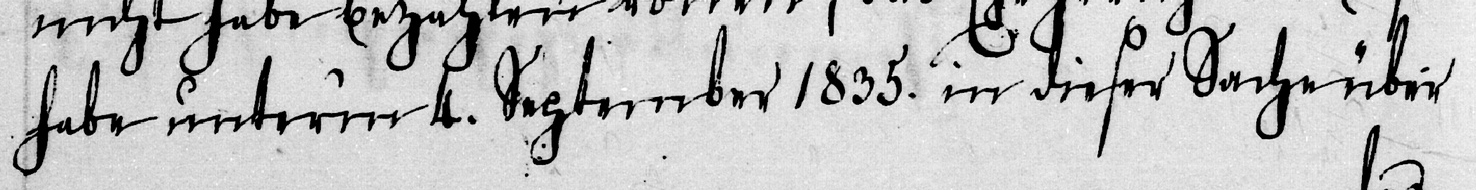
habe unterm 4. September 1835. in dieser Sache über
